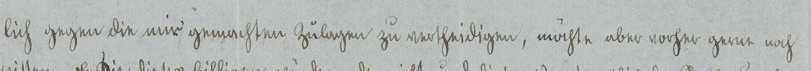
lich gegen die mir gemachten Zulagen zu vertheidigen, möchte aber vorher gerne noch
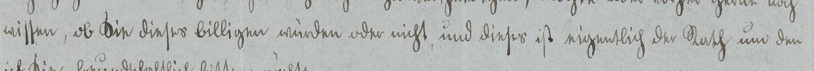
wissen, ob Sie dieses billigen würden oder nicht, und dieses ist eigentlich der Rath um den
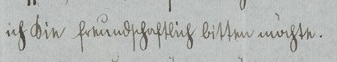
ich Sie freundschaftlich bitten möchte.
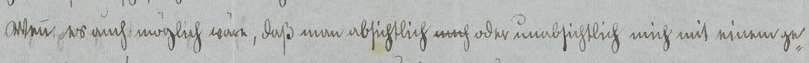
Wenn es auch möglich wäre, daß man absichtlich mich oder unabsichtlich mich mit einem ge-
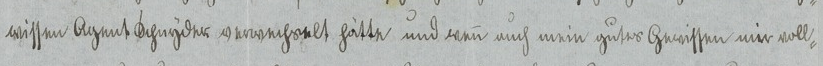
wissen Agent Schnyder verwechselt hätte und wenn auch mein gutes Gewissen mir voll-
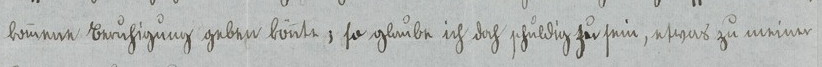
kommen Beruhigung geben könnte, so glaube ich doch schuldig zu sein, etwas zu meiner
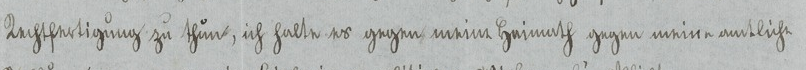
Rechtfertigung zu thun, ich halte es gegen meine Heimath gegen meine amtliche
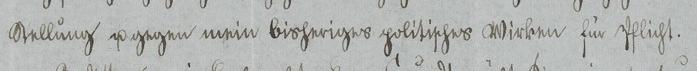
Stellung & gegen mein bisheriges politisches Wirken für Pflicht.
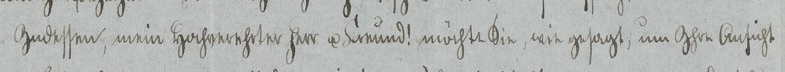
Indessen, mein hochverehrter Herr & Freund! möchte Sie, wie gesagt, um Ihre Ansicht
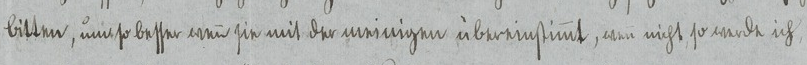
bitten, um so besser wenn sie mit der meinigen übereinstimmt, wenn nicht, so werde ich,
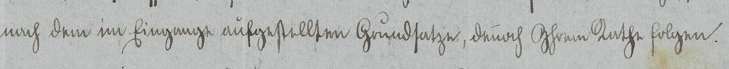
nach dem im Eingange aufgestellten Grundsatze, dennoch Ihrem Rathe folgen.
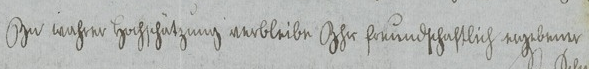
In wahrer Hochschätzung verbleibe Ihr freundschaftlich ergebener
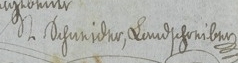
R. Schneider, Landschreiber
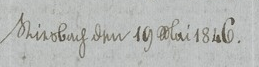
Riesbach den 19 Mai 1846.
